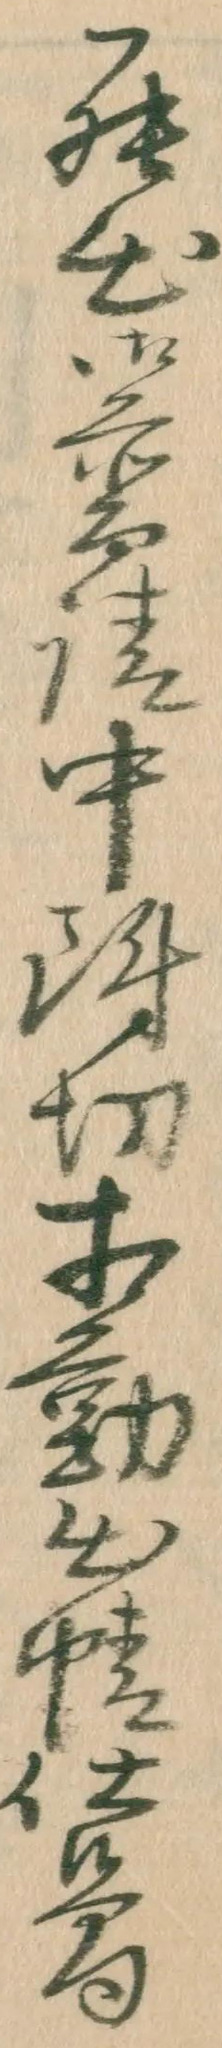罷出御普請中附切相勤出情仕候間
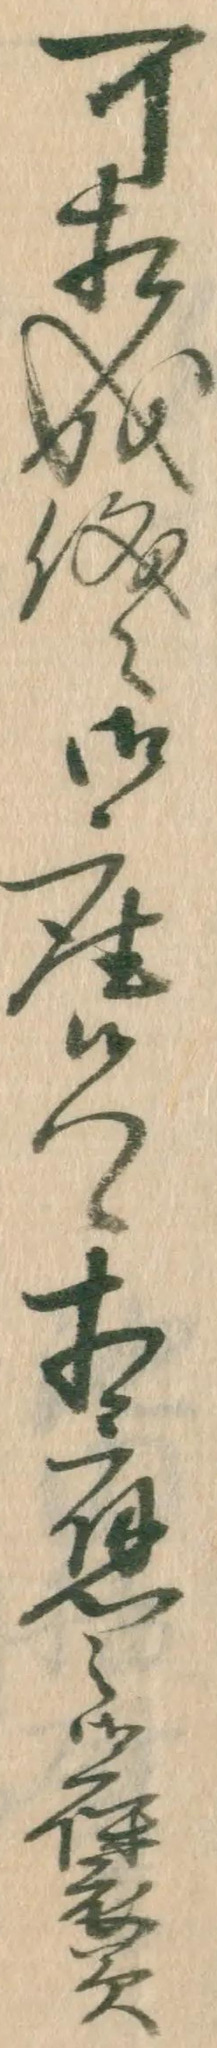可相成儀ニ御座候ハヽ相応之御褒美
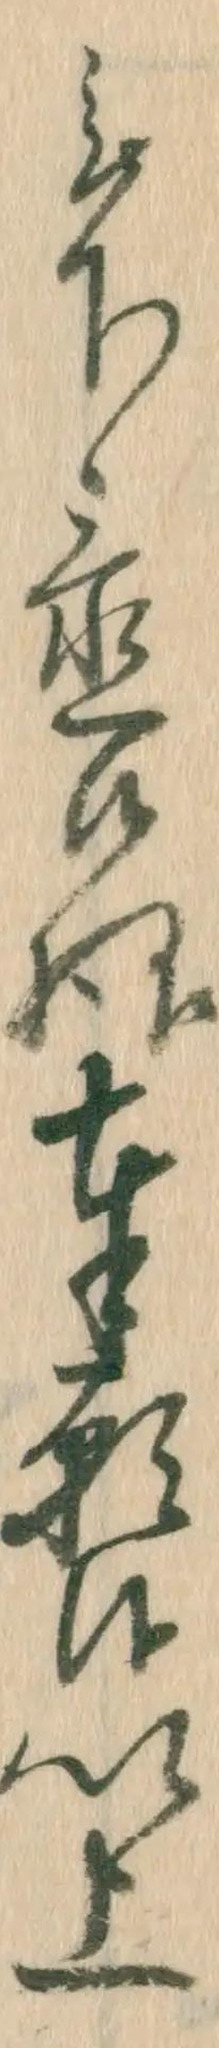被下置候様奉願候以上
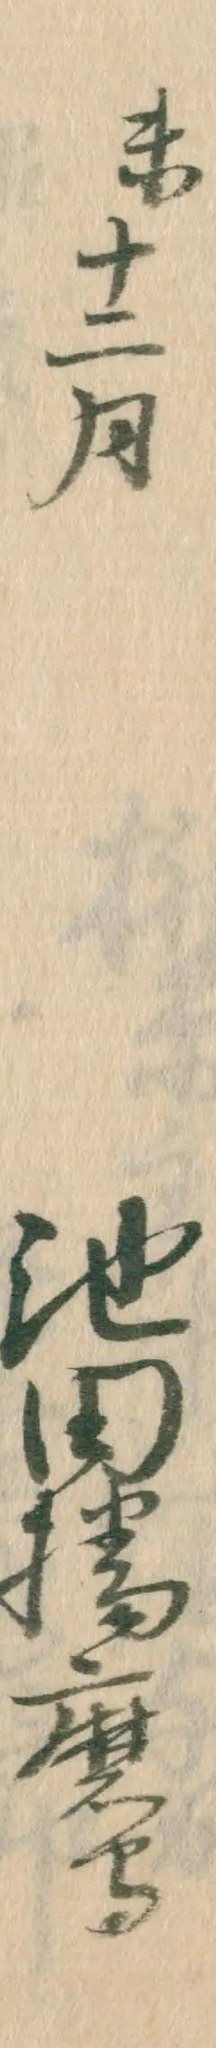未十二月池田播磨守
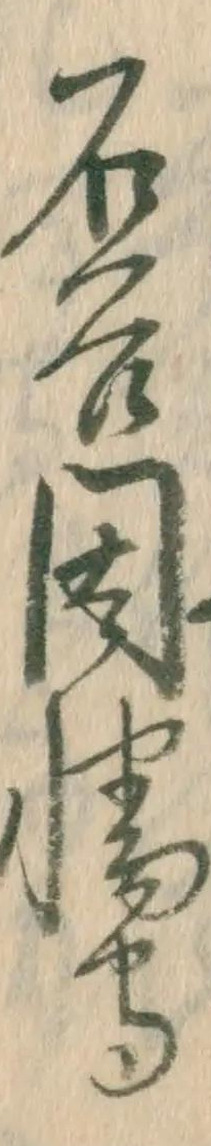石谷因幡守

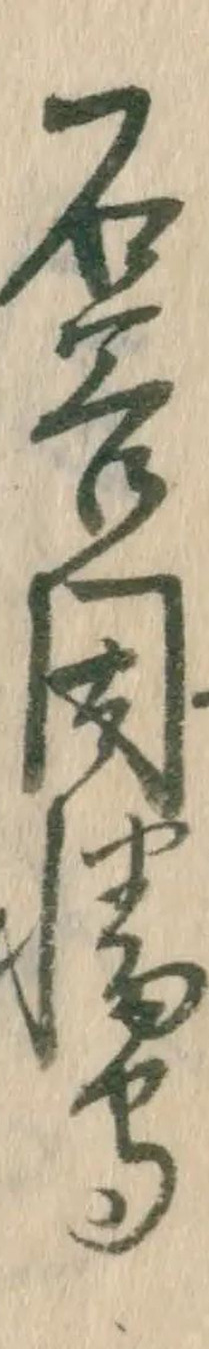│石谷因幡守
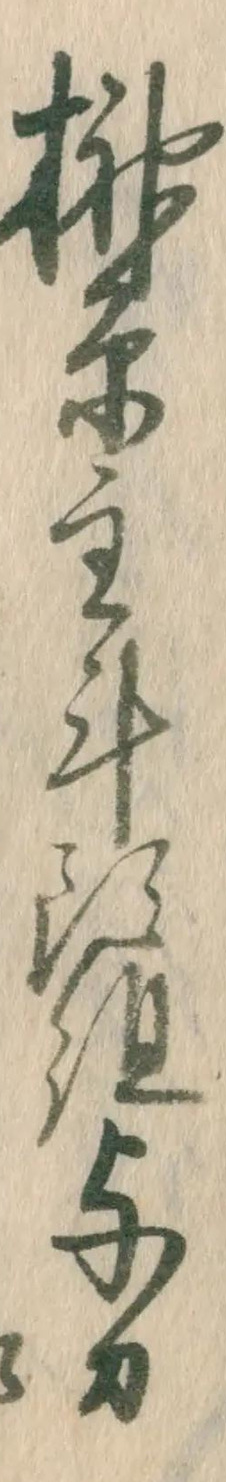榊原主計頭組与力
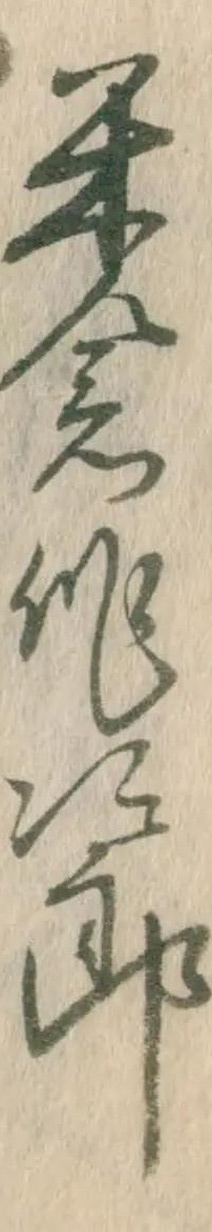米倉作次郎
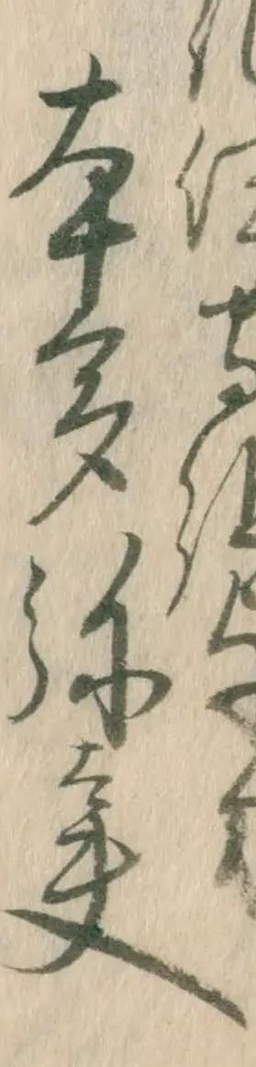本多弥太夫

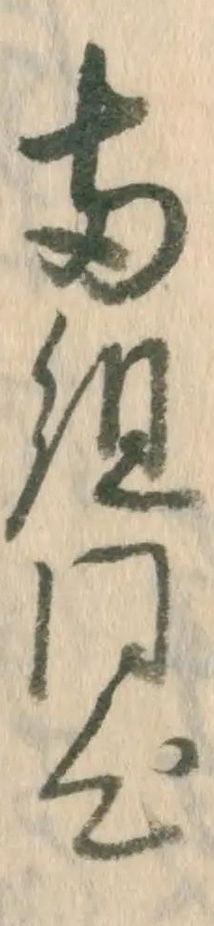両組同心
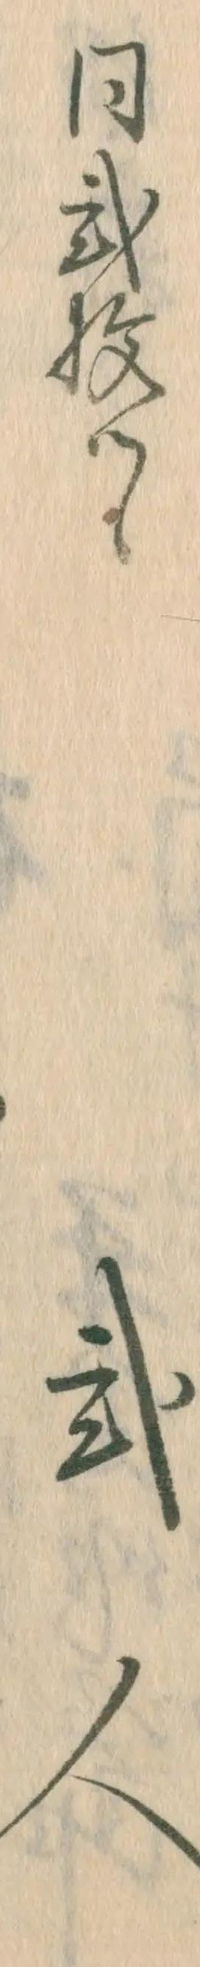同弐枚ツヽ弐人
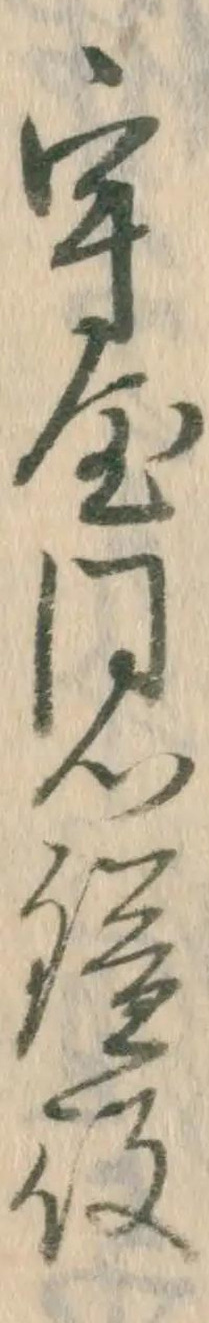牢屋同心鎰役
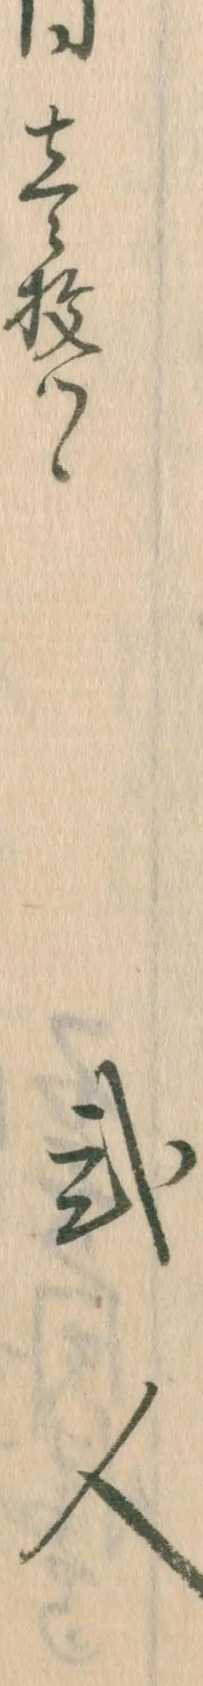同壱枚ツヽ弐人
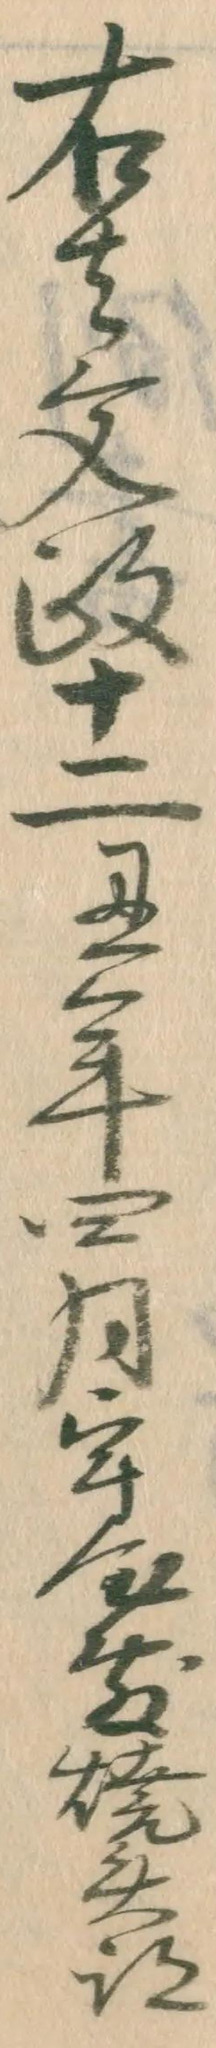右は文政十二丑年四月牢屋敷焼失跡
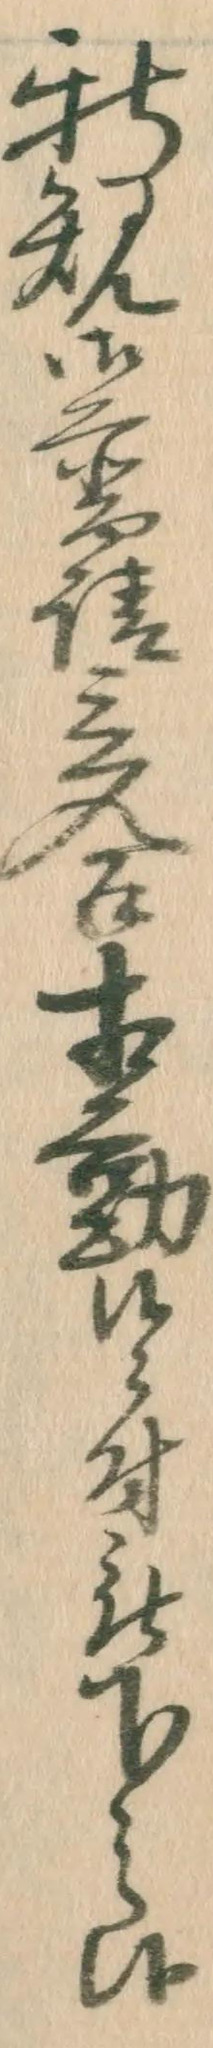新規御普請立合相勤候ニ付被下之候
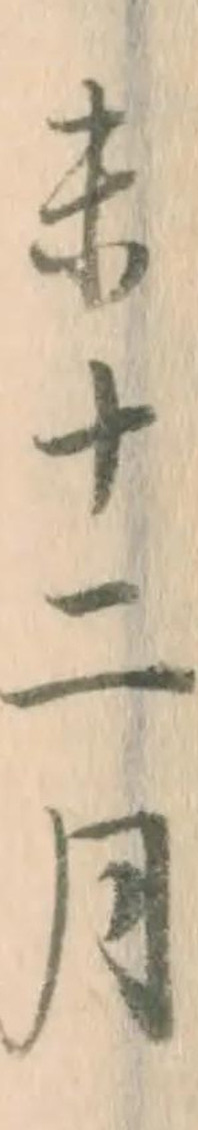未十二月
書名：七十冊物類集 71巻. [44] 四十三 牢屋敷御普請御修覆地震ニ付骨折候牢屋掛御褒美之部
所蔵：国立国会図書館 National Diet Library, JAPAN
